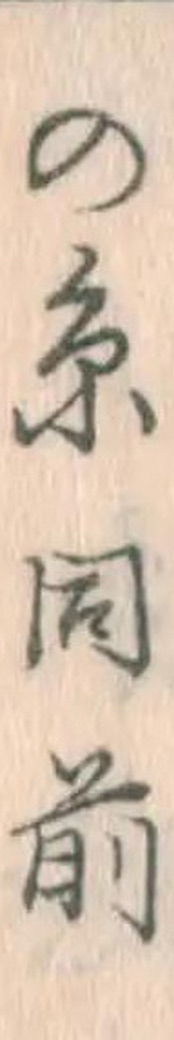の糸同前
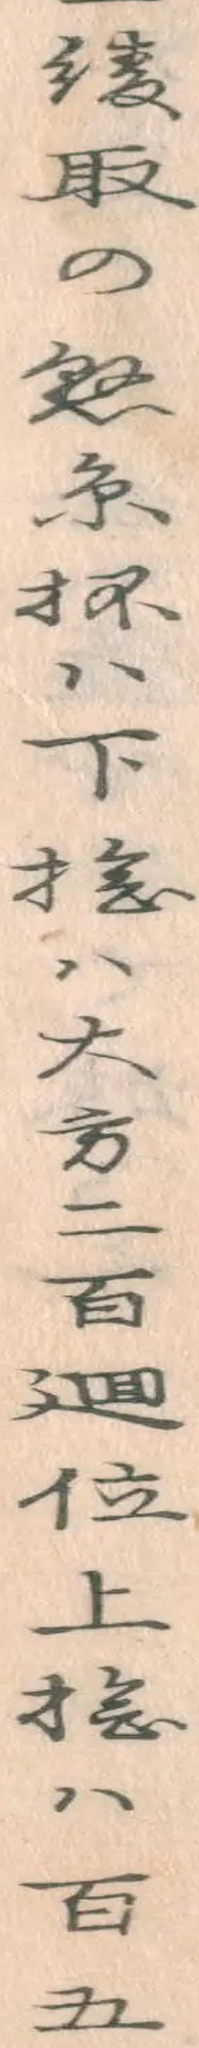一綾取の懸糸抔は下捻は大方二百廻位上捻は百五
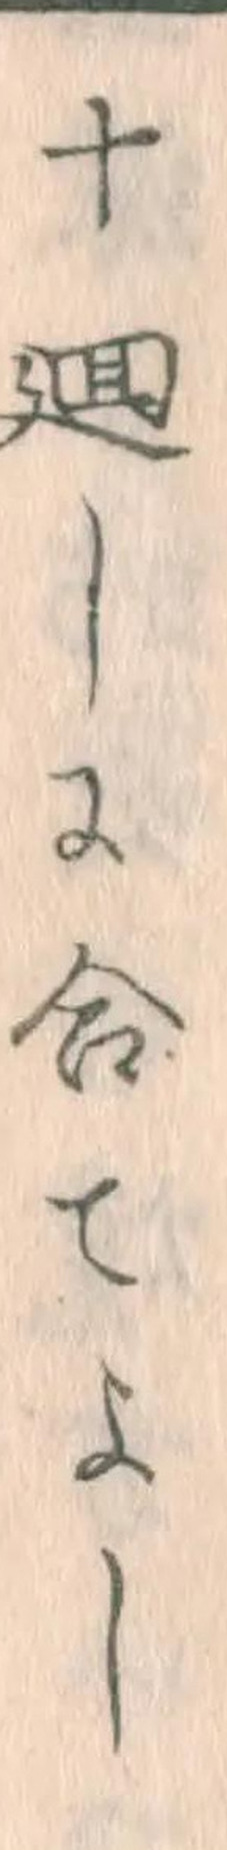十廻しに合てよし
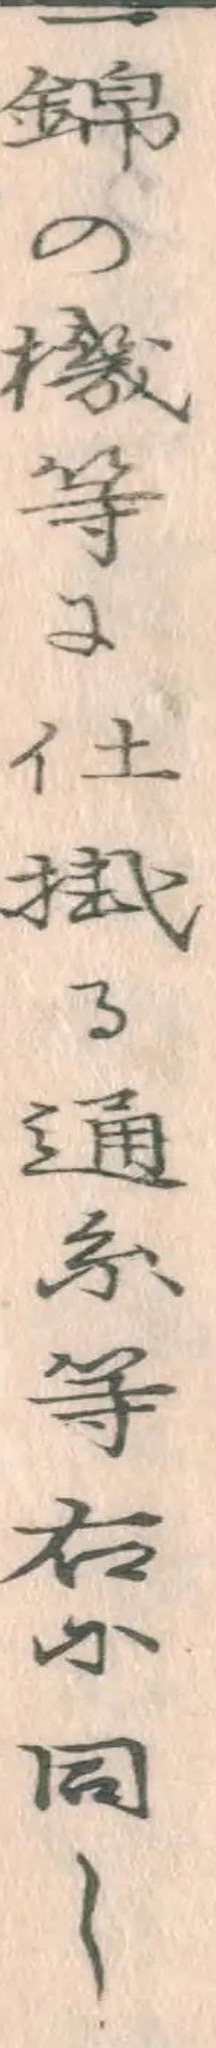一錦の機等に仕掛る通糸等右に同し
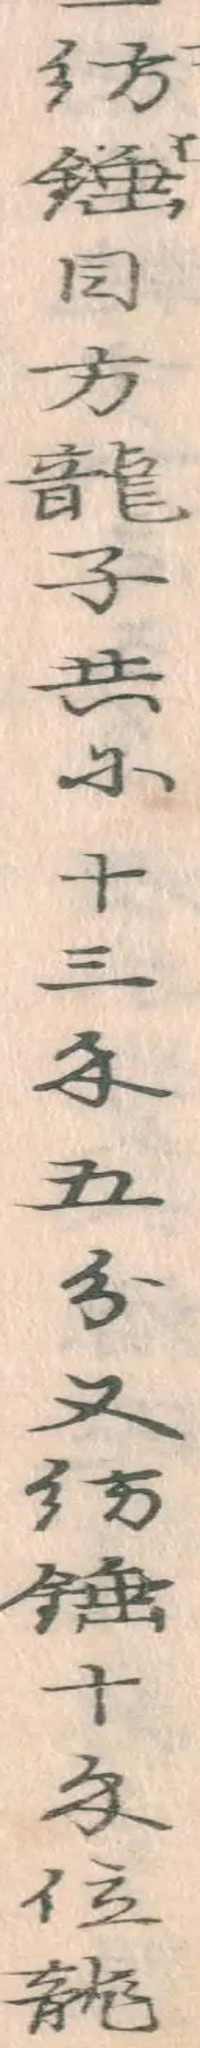一紡錘目方竜子共に十三匁五分又紡錘十匁位竜
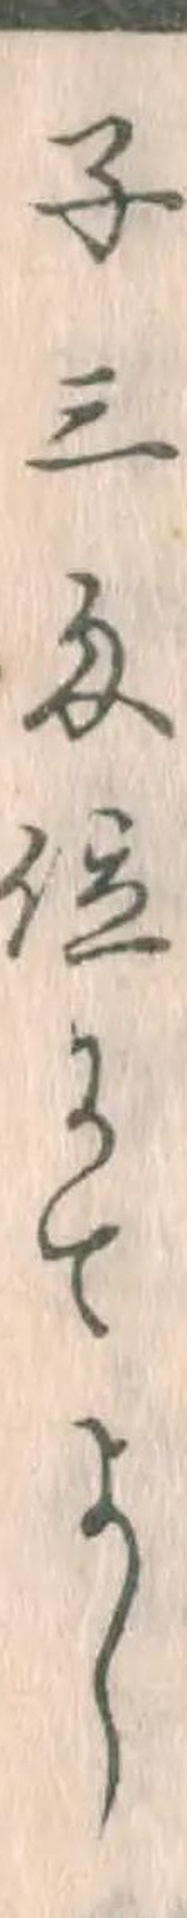子三匁位にてよし
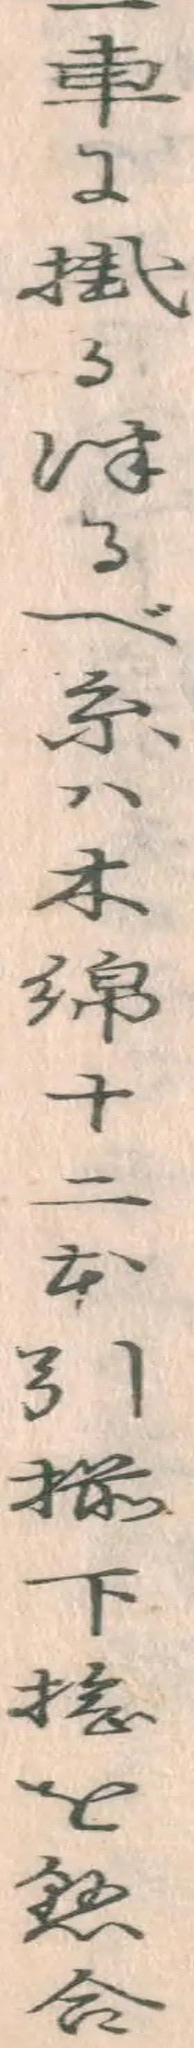一車に掛るつるべ糸は木綿十二本引揃下捻を懸合
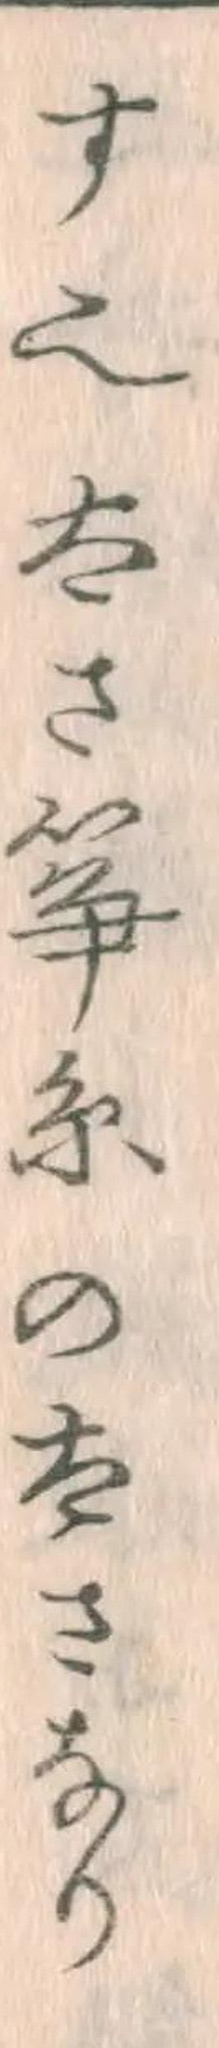す也太さ箏糸の太さなり
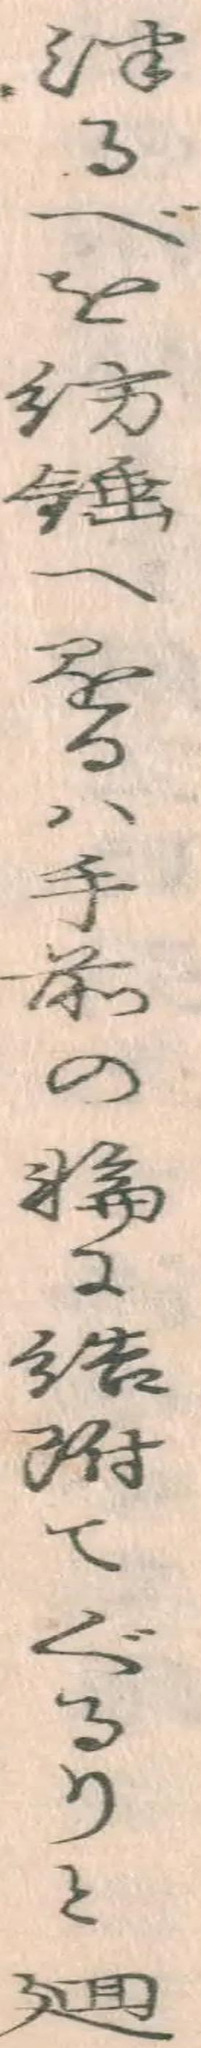一つるべを紡錘へ懸るは手前の輪に結附てぐるりと廻
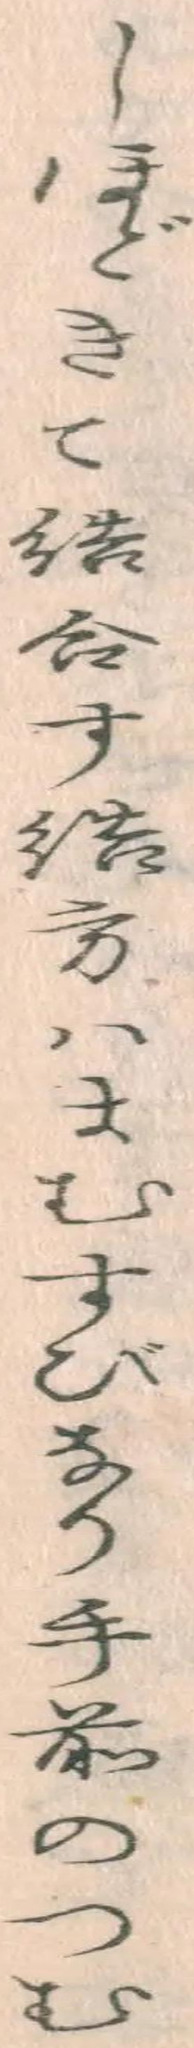しほどきて結合す結方はまむすびなり手前のつむ
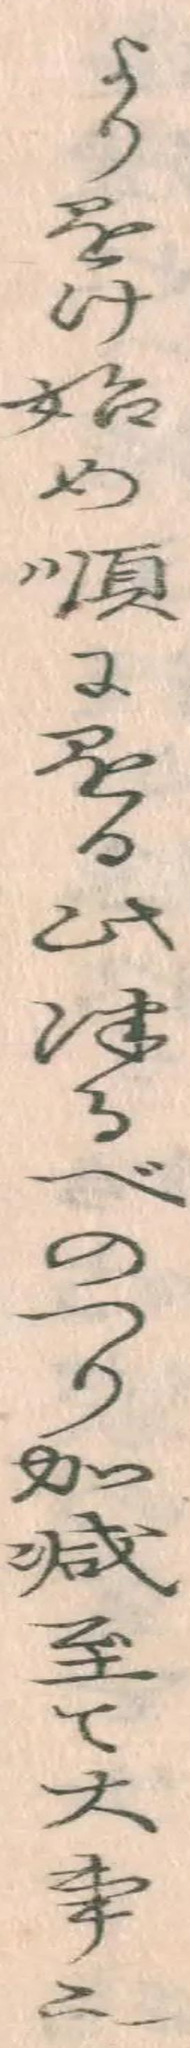より懸け始め順に懸る此つるべのつり加減至て大事也
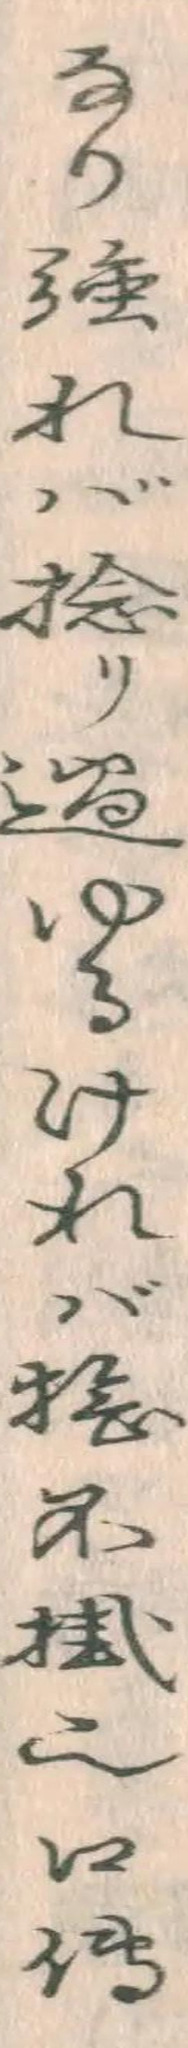なり強れば捻り過ゆるければ捻不掛也口伝
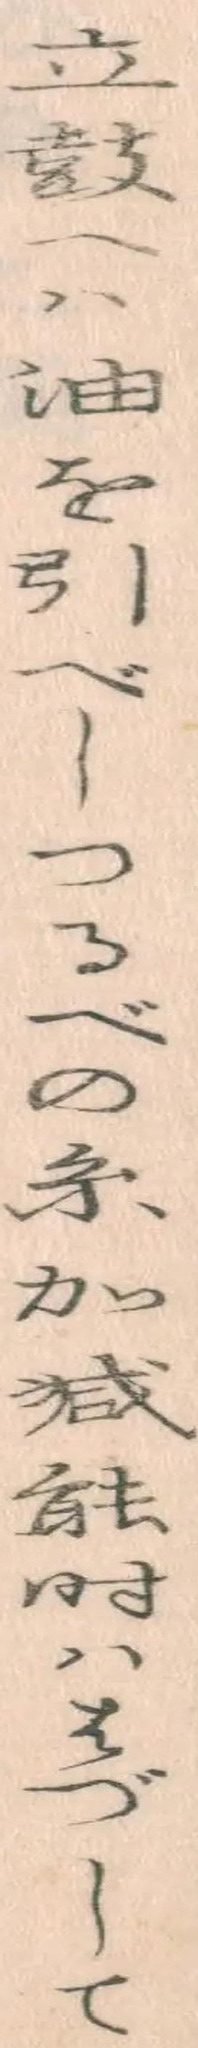立鼓へは油を引べしつるべの糸加減能時ははづして
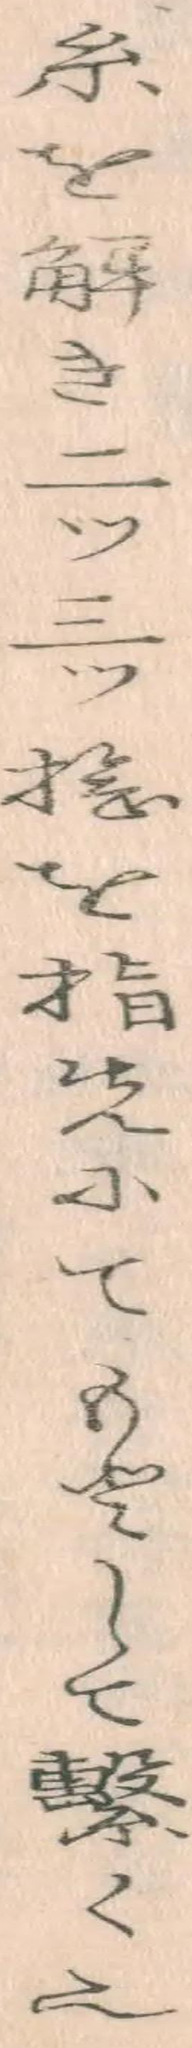糸を解き二ッ三ッ捻を指先にてもとして繋く也
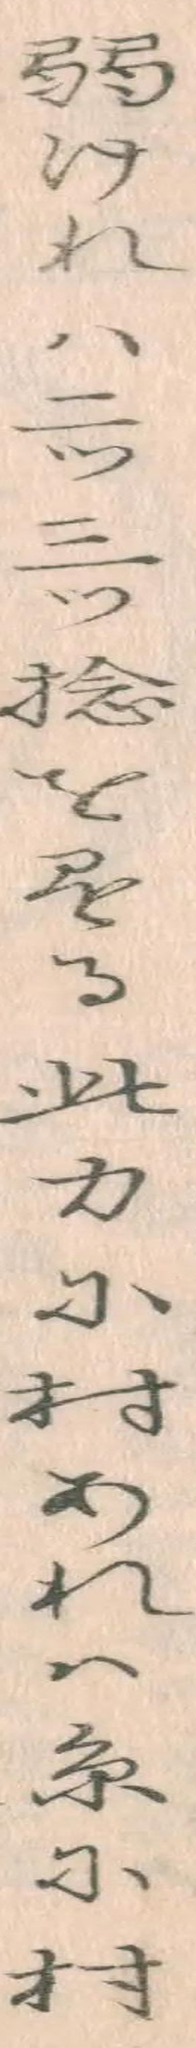弱けれは二ッ三ッ捻を懸る此力に村あれは糸に村
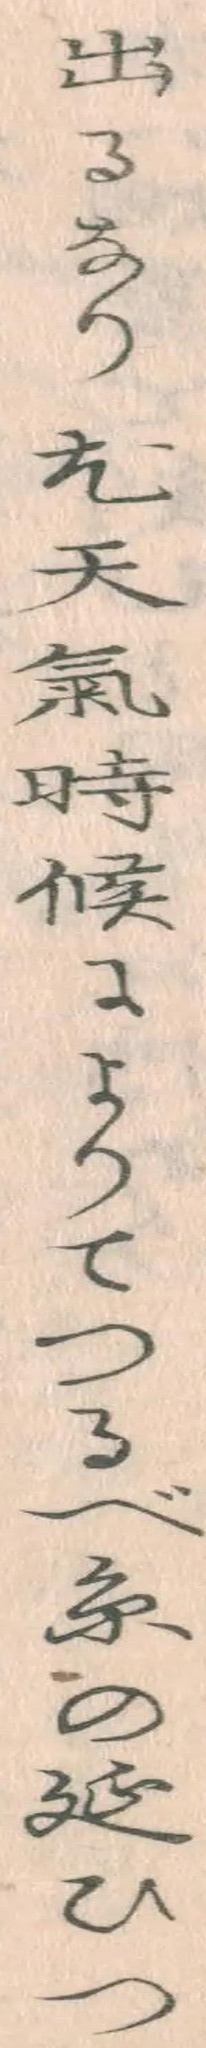出るなり尤天気時候によりてつるべ糸の延ひつ
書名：機織彙編 5巻. [1]
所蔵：国立国会図書館 National Diet Library, JAPAN
